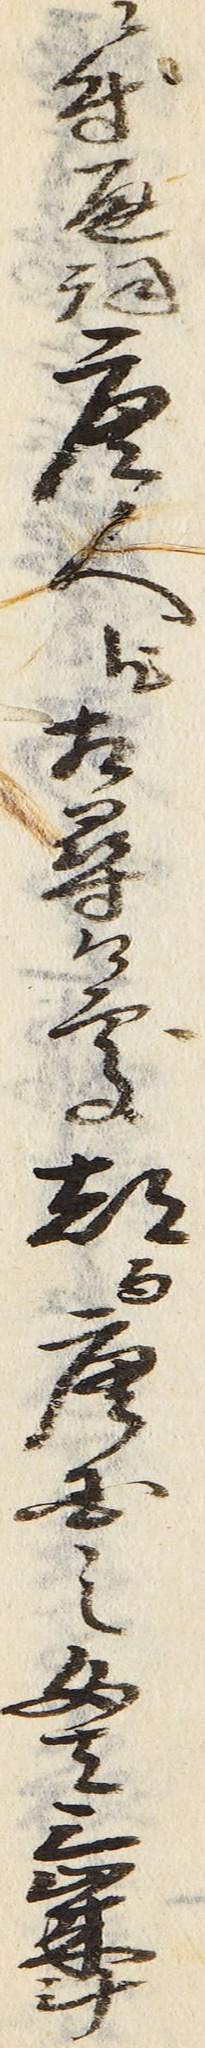ニ付通詞唐人江相尋候處都而唐国之女者三歳斗
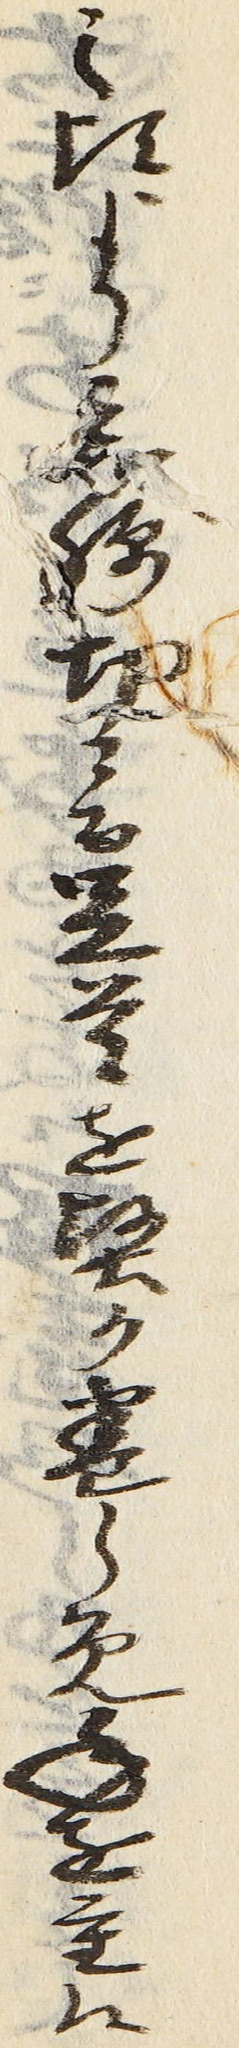之比より毛綿切ニ而足首を堅ク巻しめ年を重ね
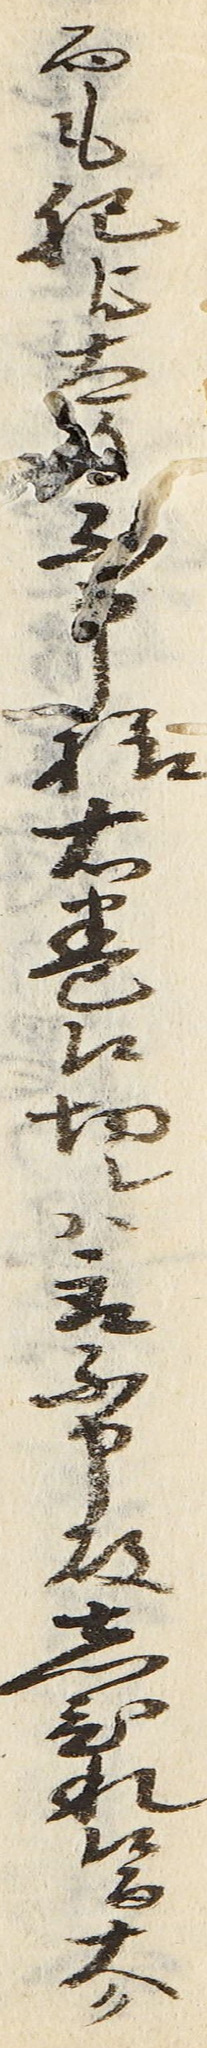而も肥江太ク不申様右巻候切レハ取不申故しひれ候而太ク
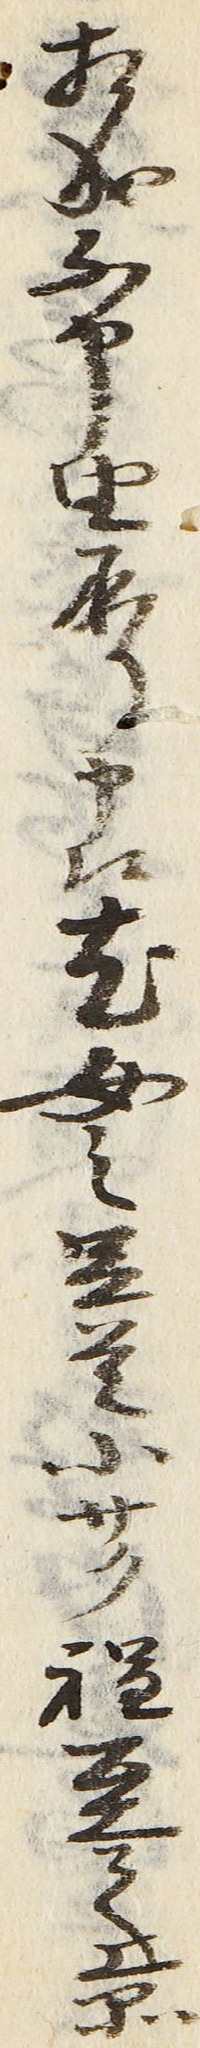相成不申由承り申候尤女之足首小サク程至て上品
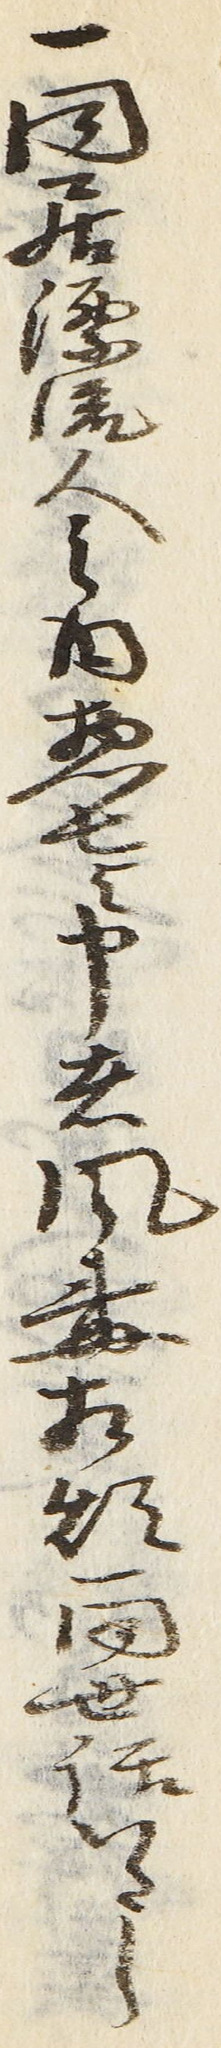一同居漂流人之内惣七と申者風毒相煩一同世話いたし
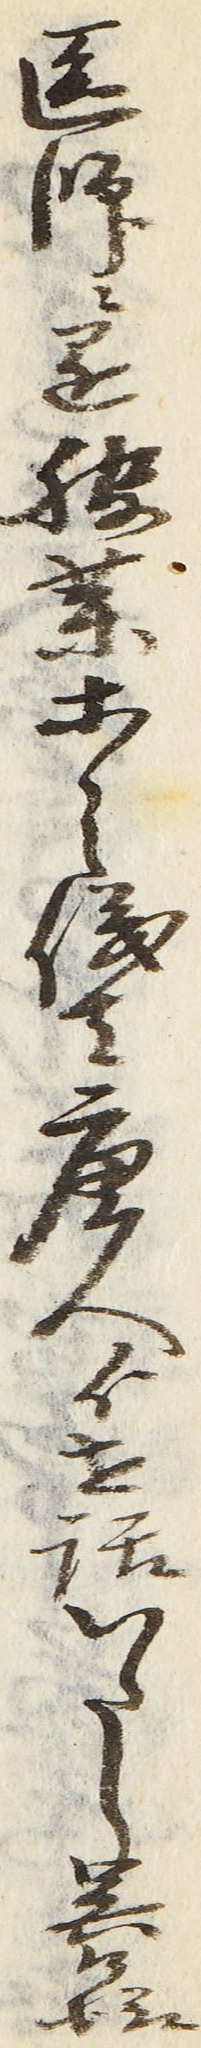医師ニ懸服薬等之儀者唐人ゟ世話いたし呉候様
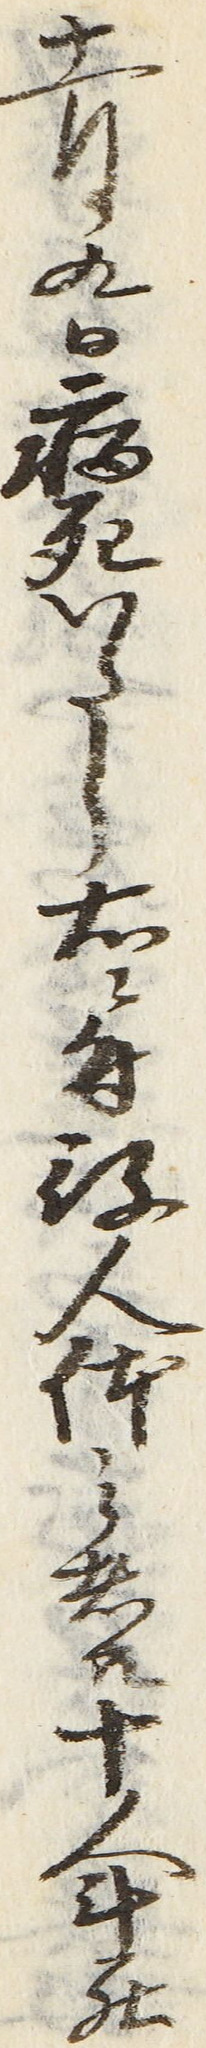十一月九日病死いたし右ニ付役人体之者共十人斗罷
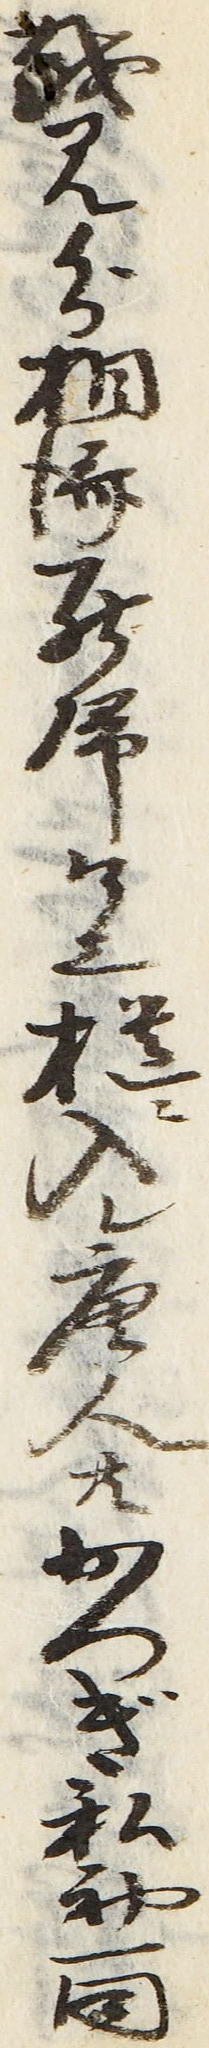越見分相濟罷帰候上樽二入レ唐人共かつぎ私初一同
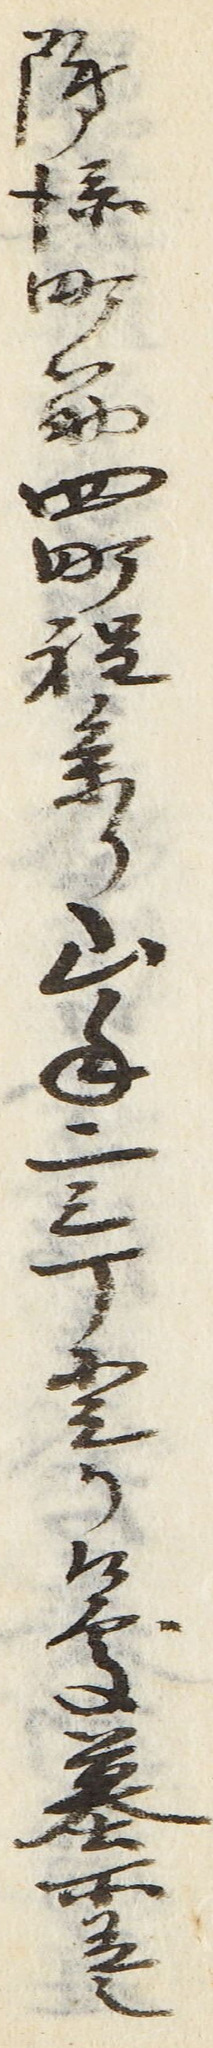附添町筋四町程参り山手二三丁登り候處墓所有之
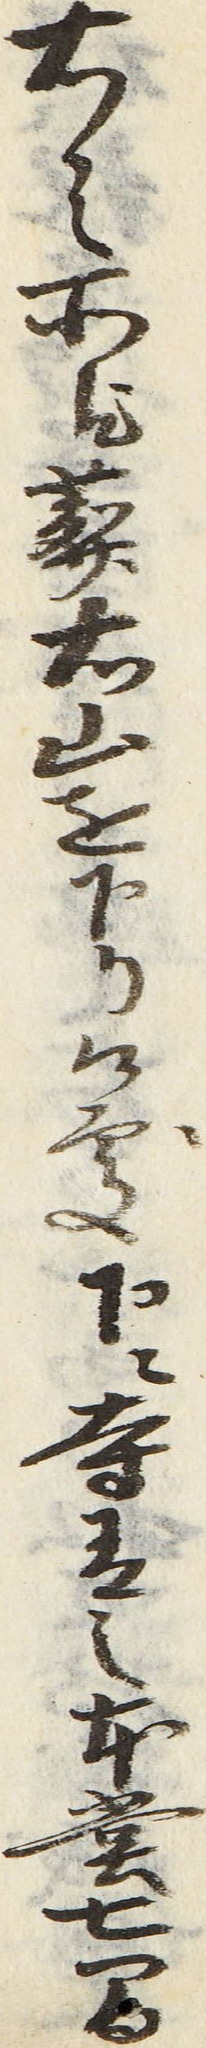右之所江葬右山を下り候處下ニ寺有之本堂七間

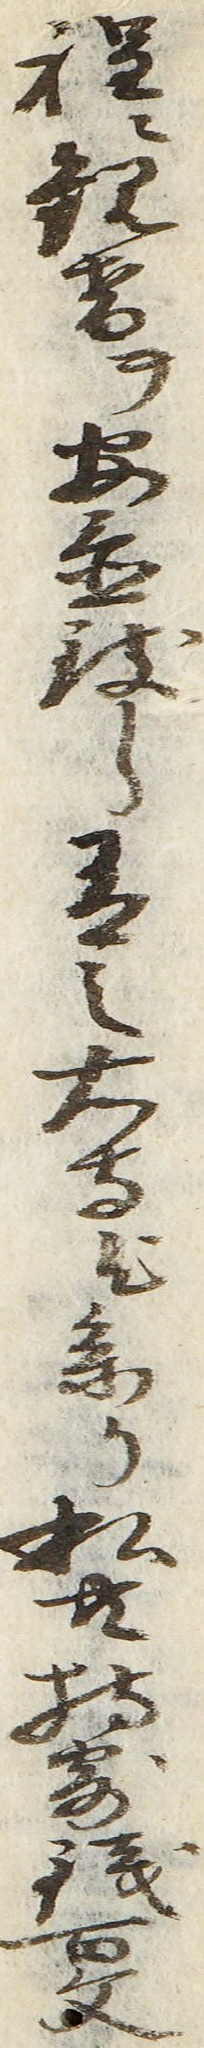程ニ観音ヲ安置致し有之右寺江参り私共持寄銭百文
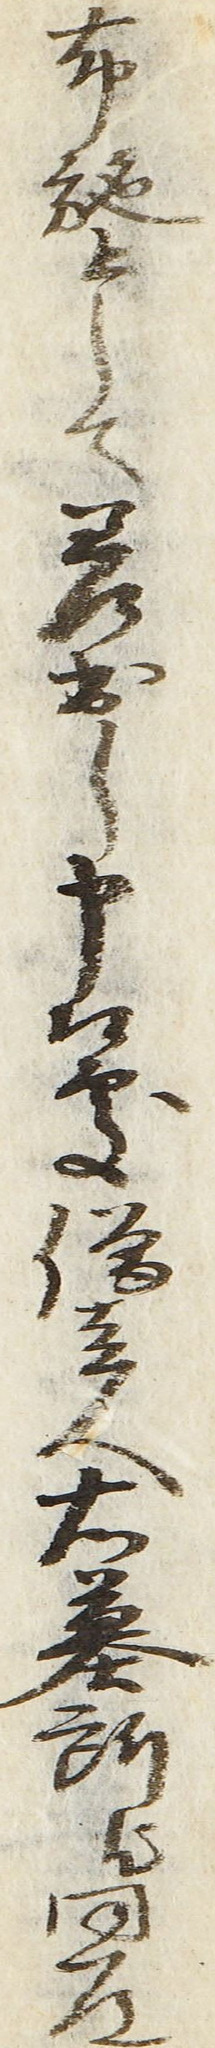布施として差出し申候處僧壱人右墓所江同道
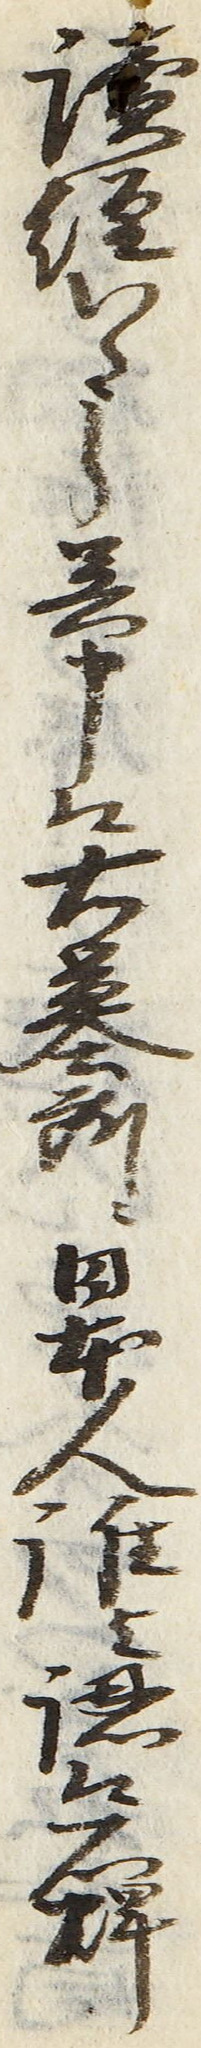讀經いたし呉申候右墓所ニ日本人誰と認候石碑
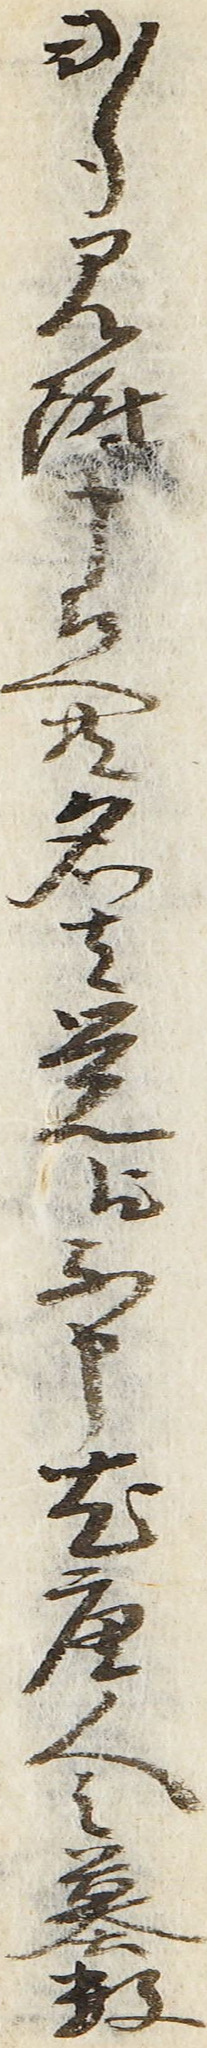弐ツ見附申候へ共名者覚江不申尤唐人之墓数
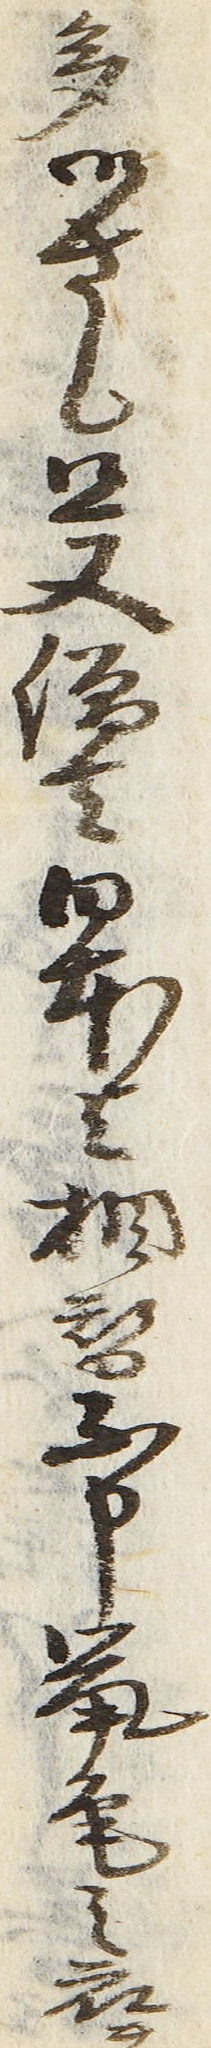多御座候且又僧者日本と相替不申鼠色之衣ヲ
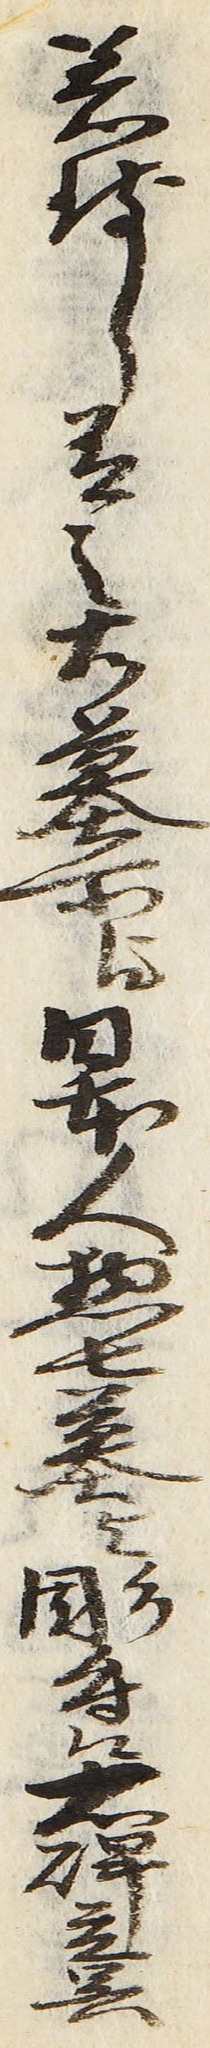着致し有之右墓所江日本人惣七墓と彫付候右碑立呉
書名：漂流人善助聞書
